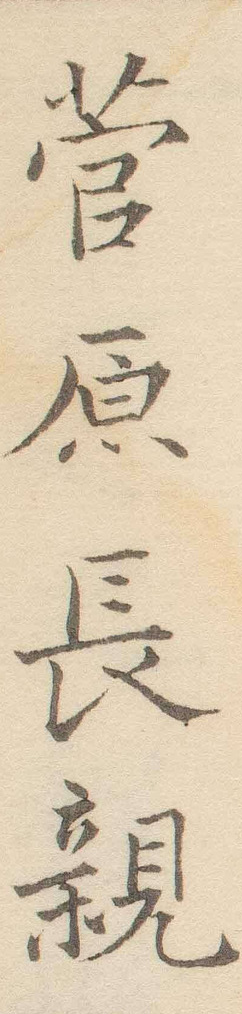菅原長親

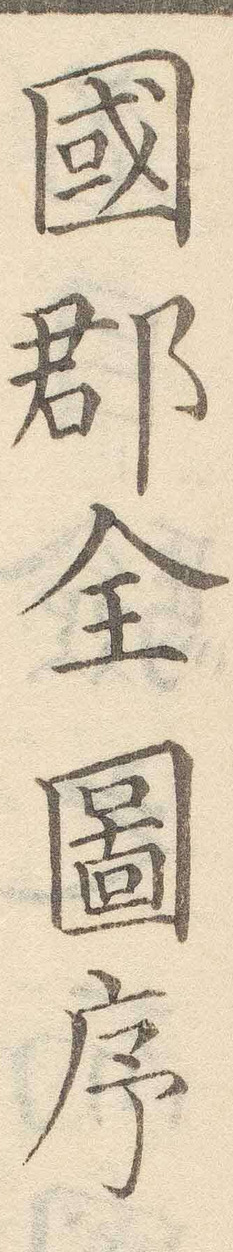国郡全図序
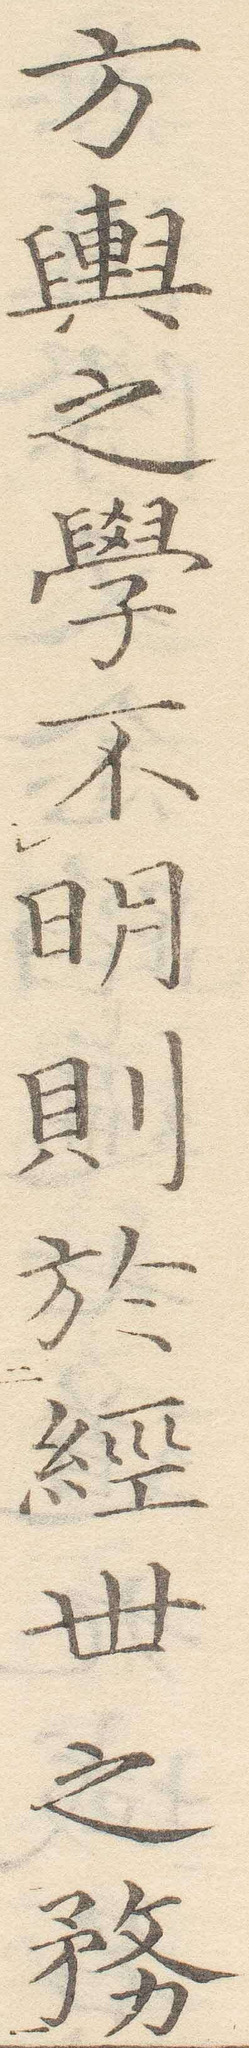方輿之学不明則於経世之務
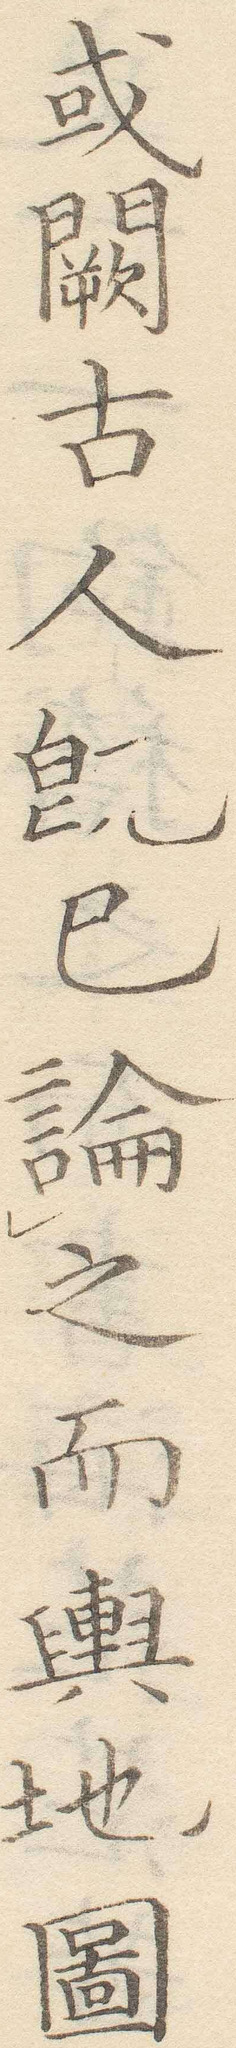或闕古人既已論之而輿地図
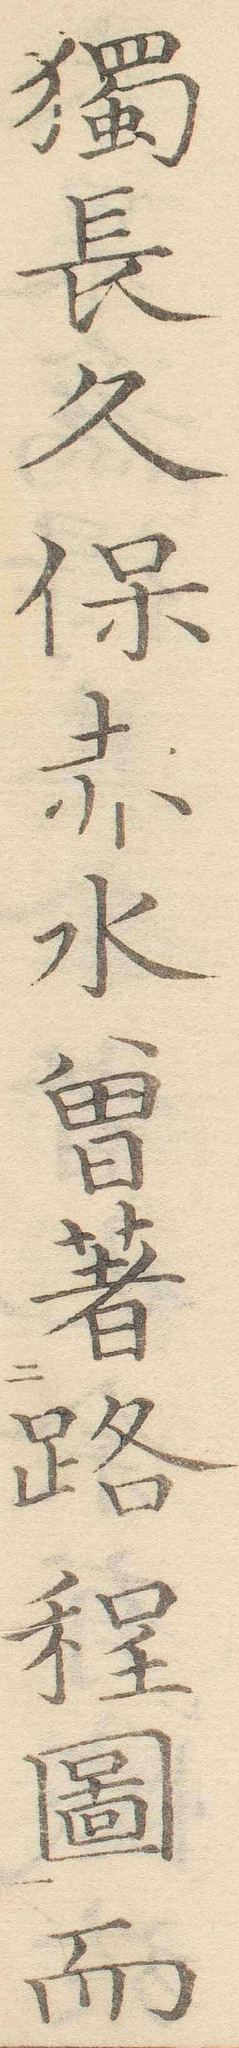独長久保赤水曽著路程図而
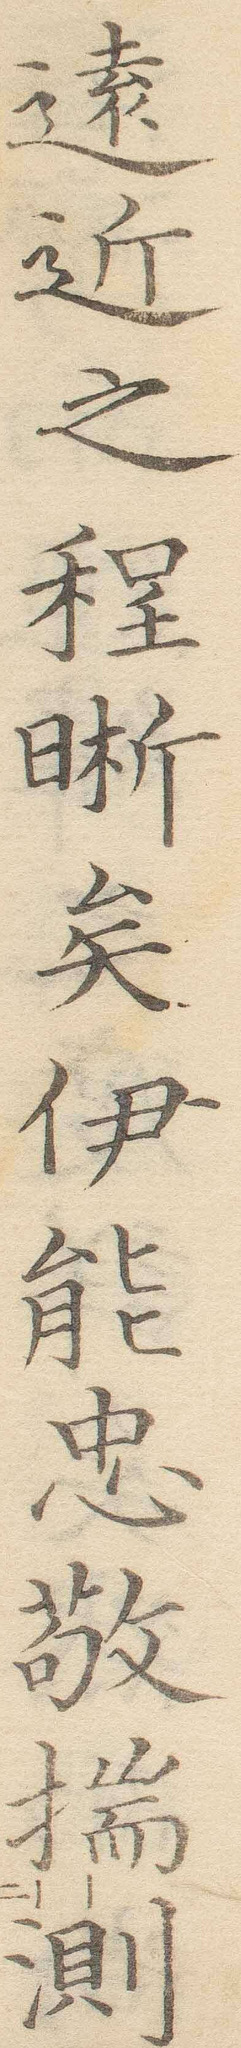遠近之程晰矣伊能忠敬揣-測

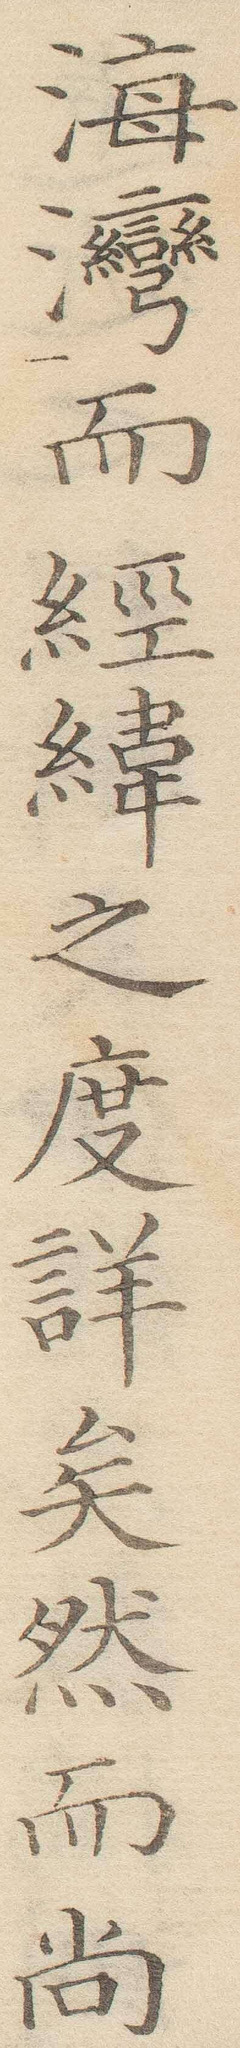海湾而経緯之度詳矣然而尚
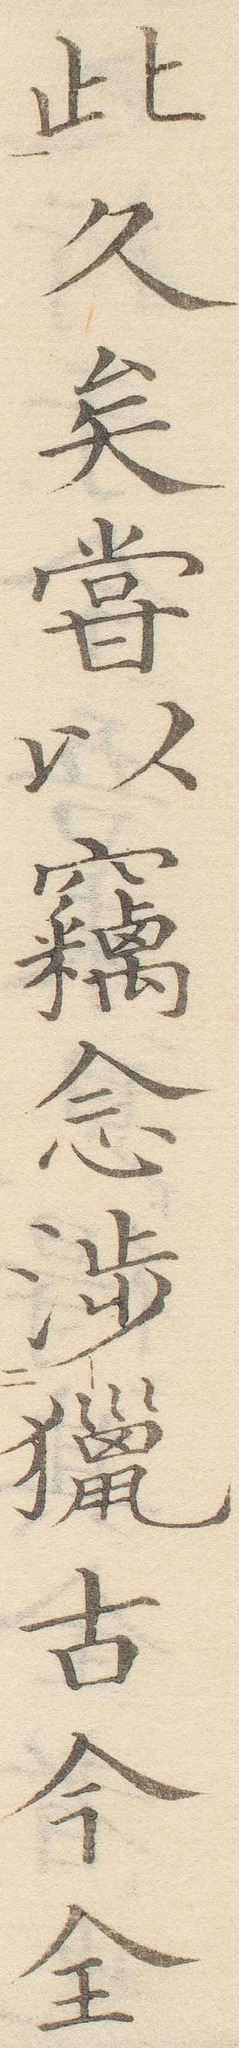此久矣甞以窃念渉-猟古今全
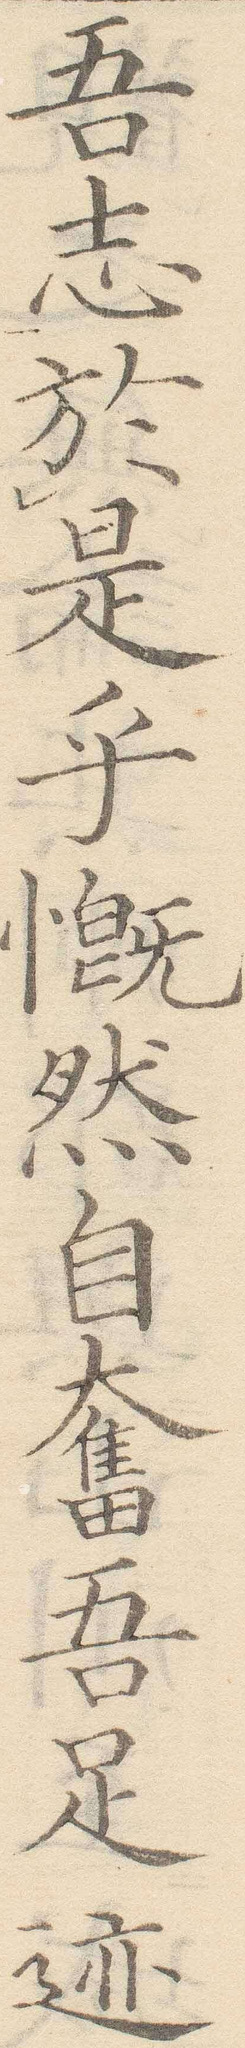吾志於是乎慨然自奮吾足迹
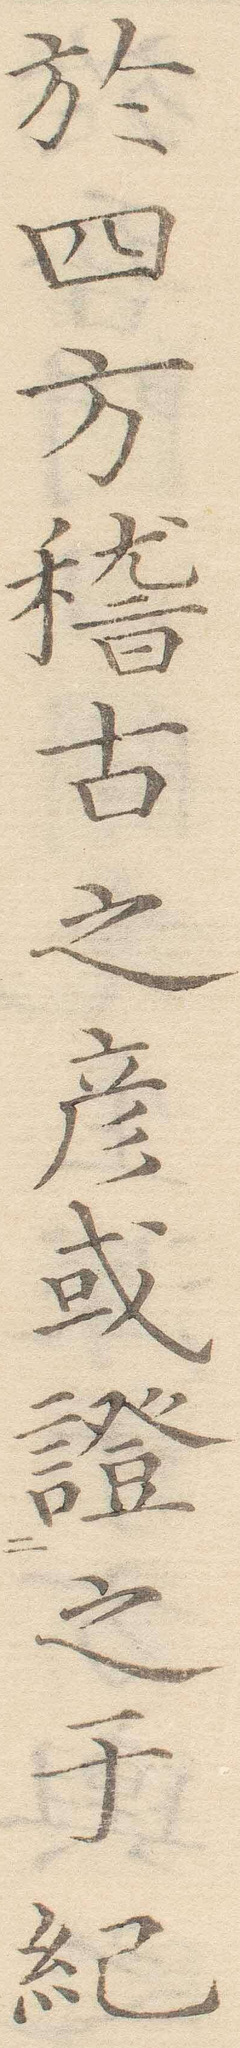於四方稽古之彦或証之于紀
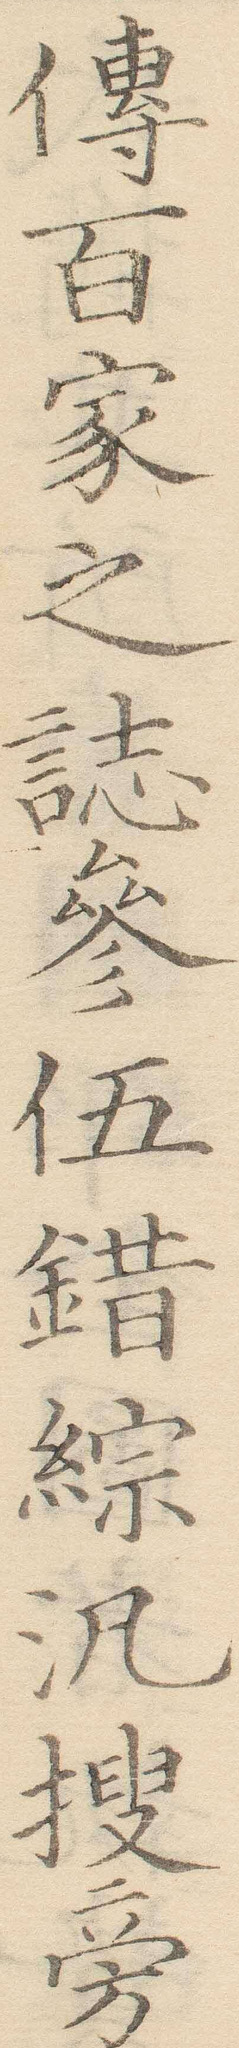伝百家之誌参伍錯綜汎捜旁
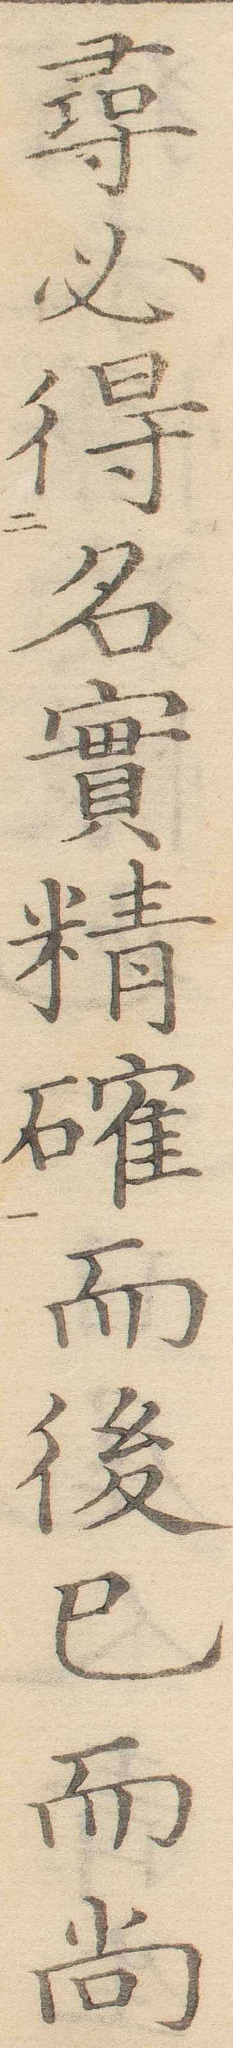尋必得名実精確而後已而尚

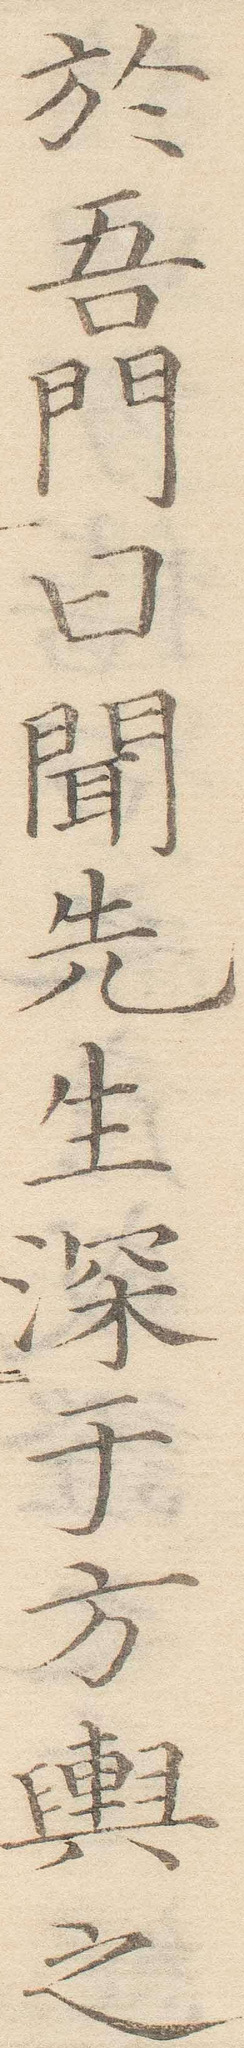於吾門曰聞先生深于方輿之
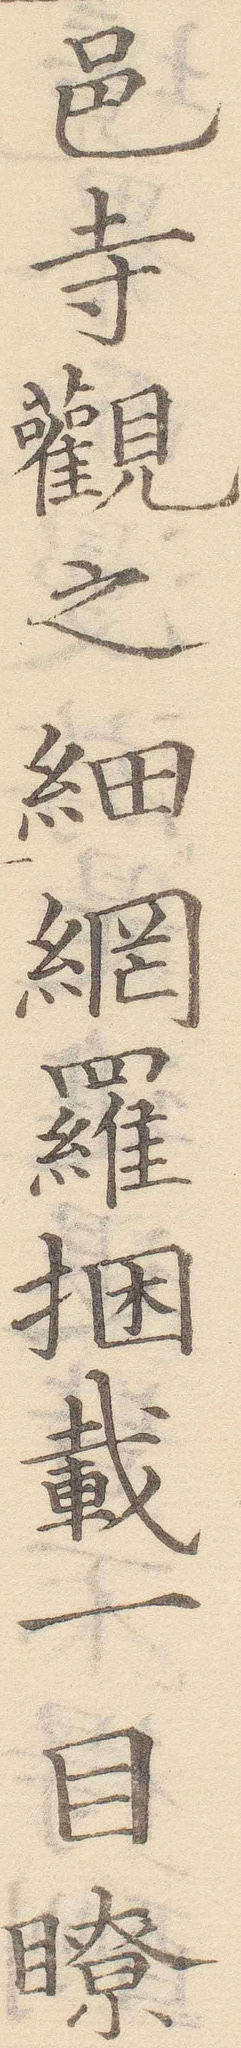邑寺観之細網羅捆載一目瞭
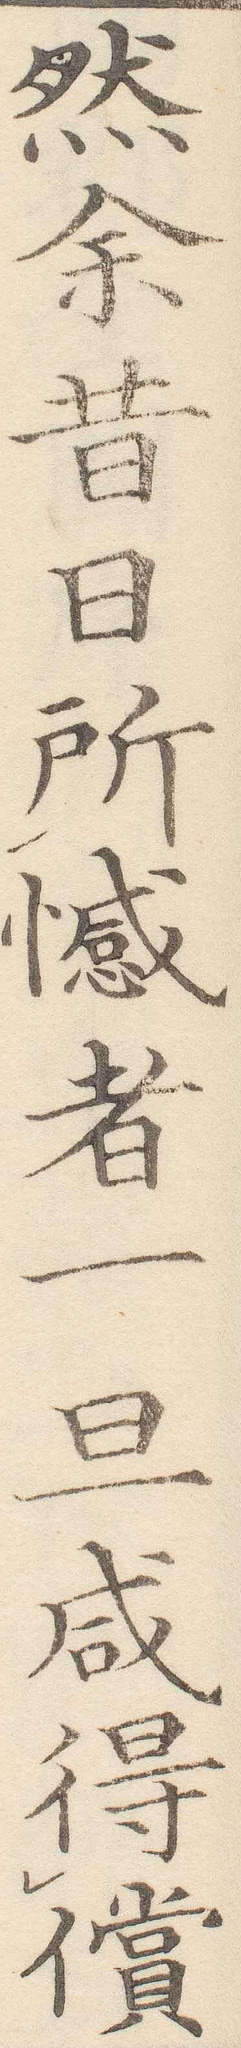然余昔日所憾者一旦咸得償
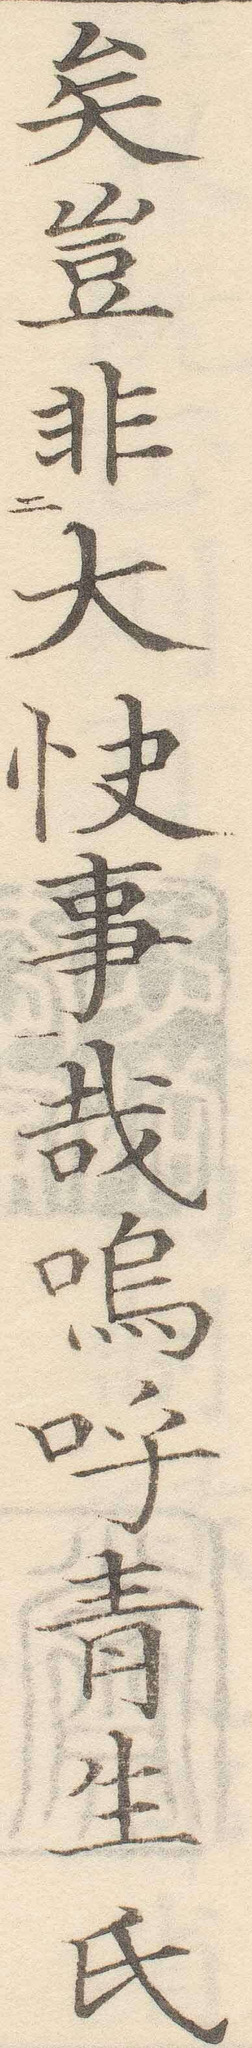矣豈非大快事哉嗚呼青生氏
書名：国郡全図
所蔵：東京学芸大学附属図書館 国文学研究資料館
